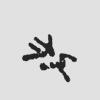寺
